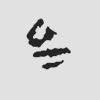蒼
